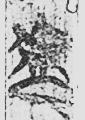者
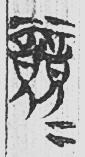競=
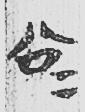公=
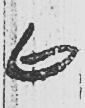㠯（以）
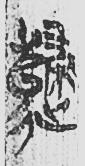{彳歸}
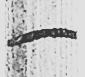一
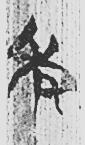年
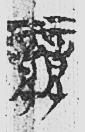競
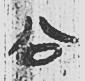公
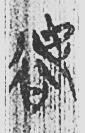欲
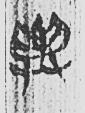與
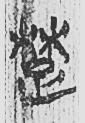楚
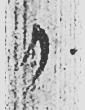人
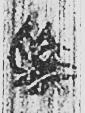爲
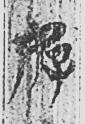好
